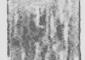卌
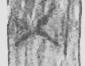五
